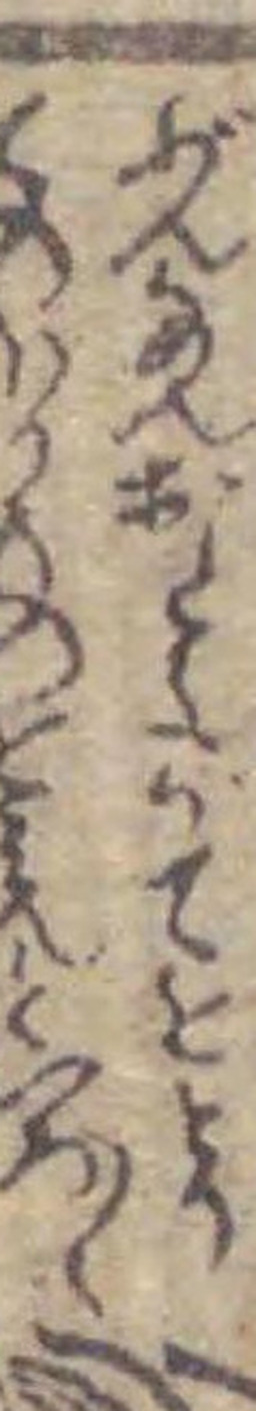てのほりものをみんといろ〳〵
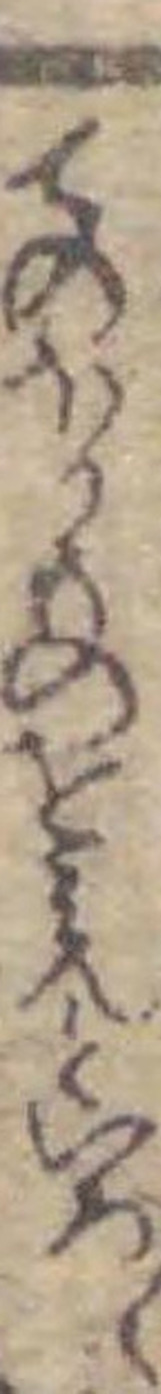てのほりものをみんといろ〳〵
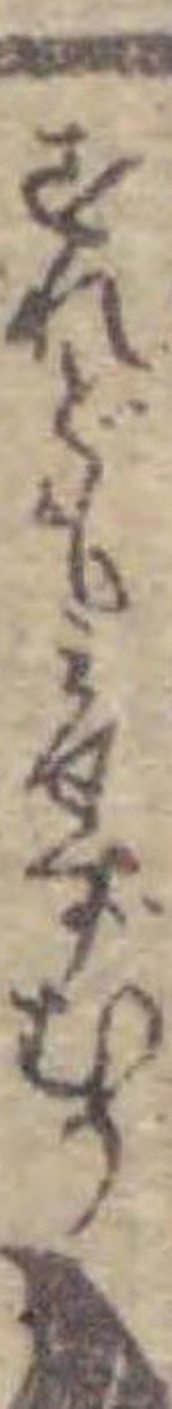すれどもみせずむり
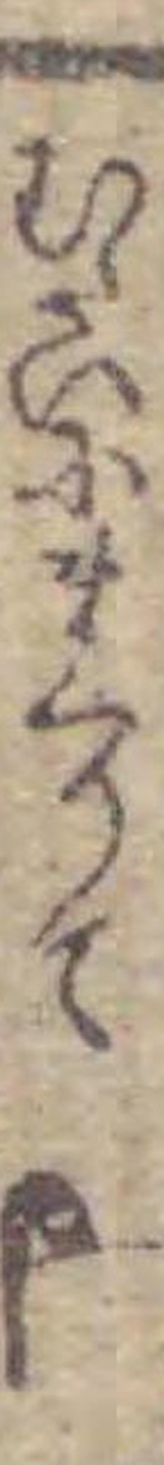むたいにまくりて
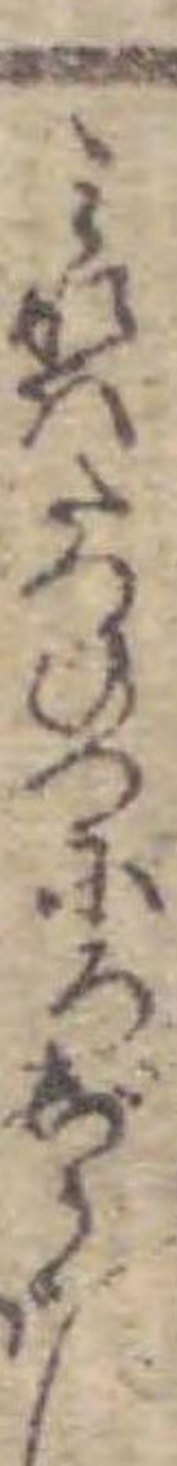みれはたつひつにろじうが
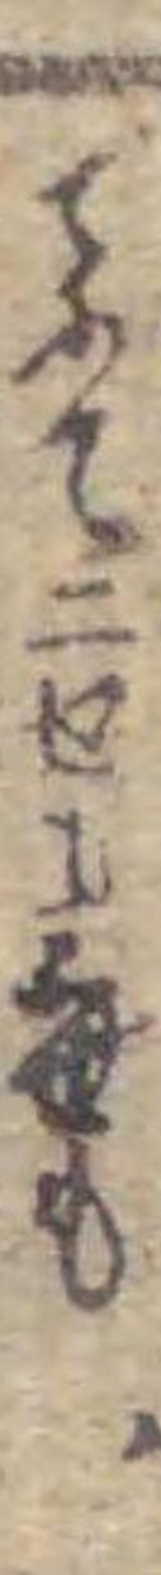てにて二せも三世も
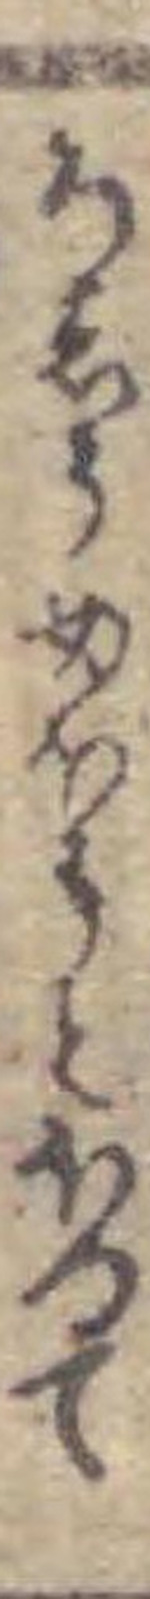ろしう女ぼうとほつて
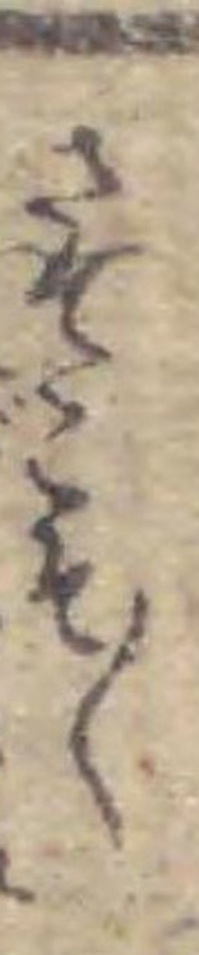さてこそ〳〵
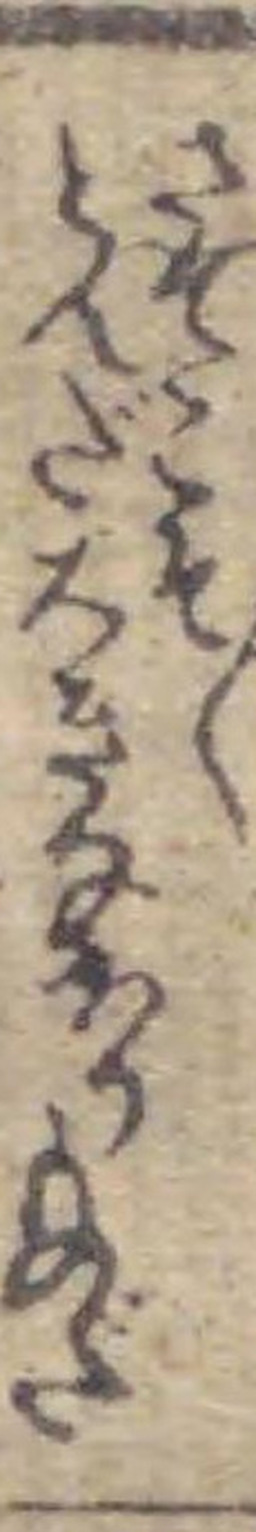とんだ大きなほりものだ
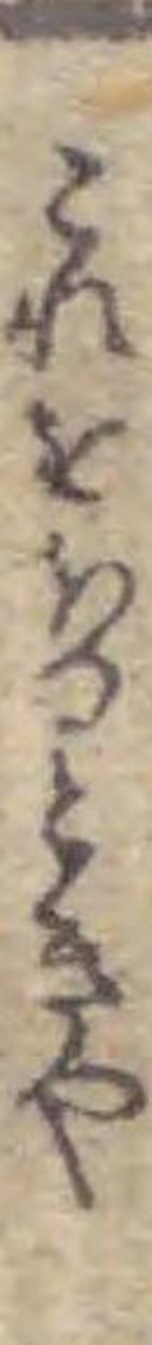これをほるときや
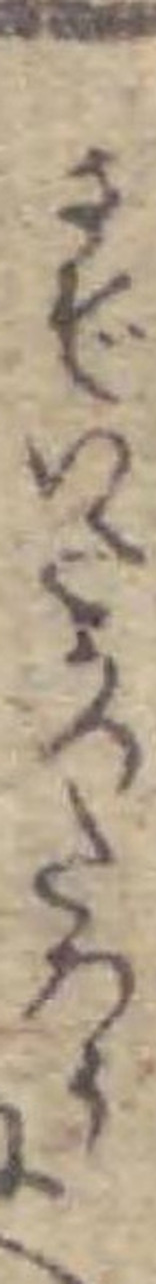さぞいたかつたろうに
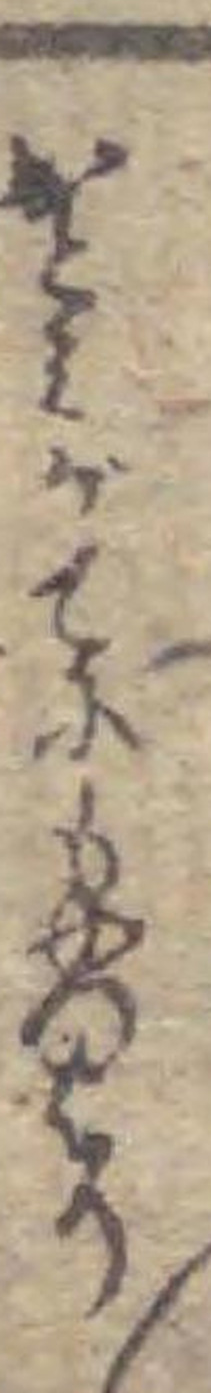おとみがてにもやつはり
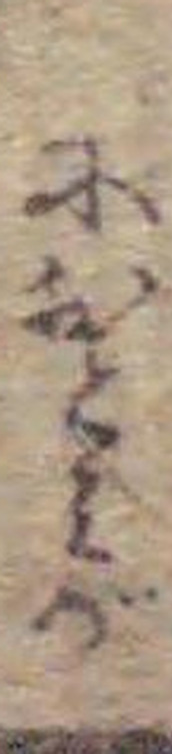におとみが
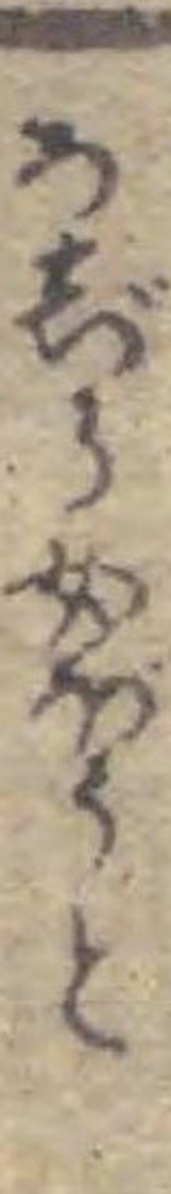ろじうが女ぼうと
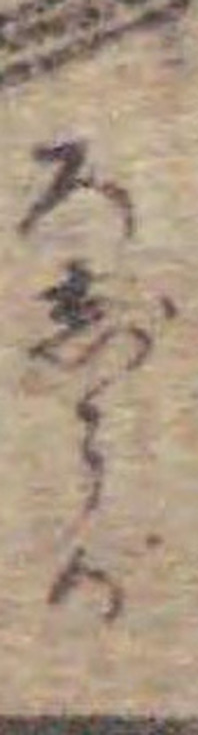ろじうが
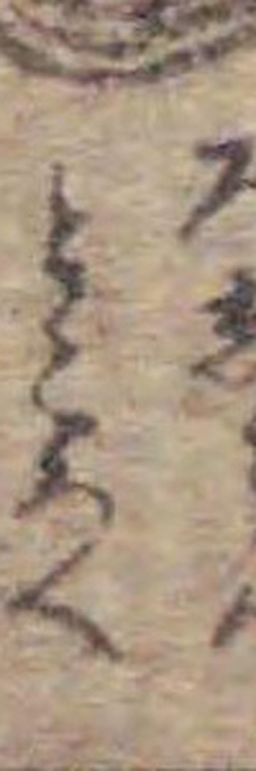ところへ
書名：芸者呼子鳥 : 2巻（松泉堂）
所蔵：国立国会図書館 National Diet Library, JAPAN
